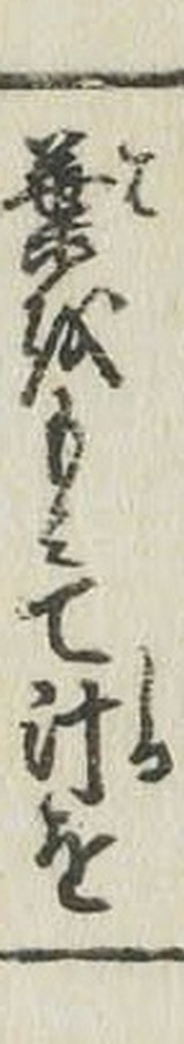葉をもみて汁を
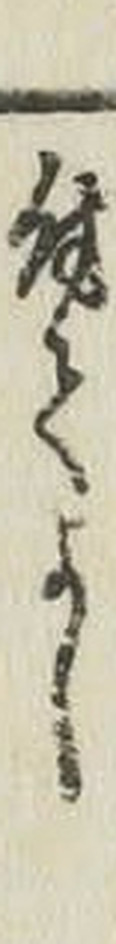付てよし
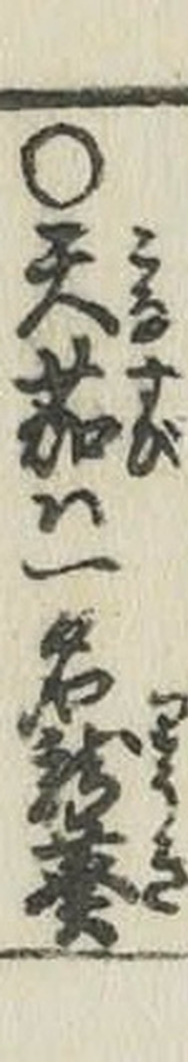○天茄は一名龍葵
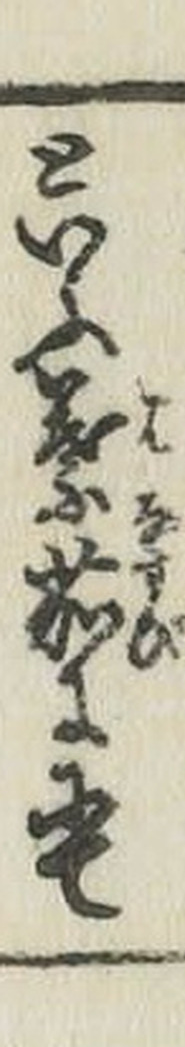といふ葉茄ににて
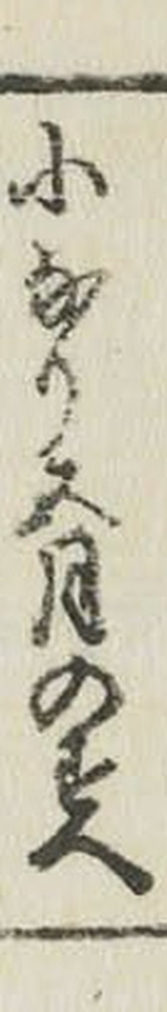小なり五月のすへ
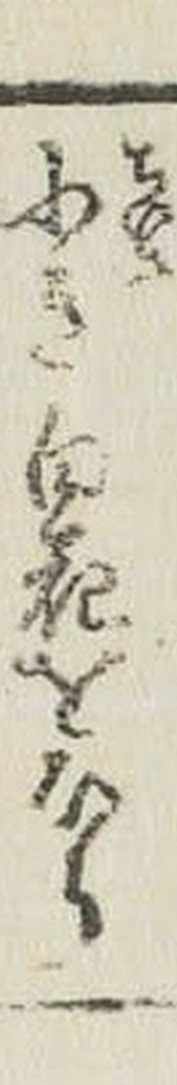小き白花をひら
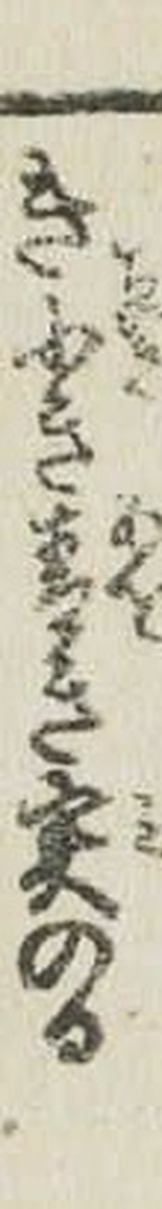き小き青き実のる
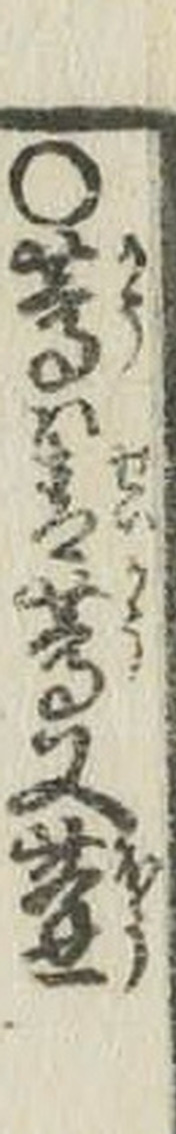○蒿は青蒿又蓬
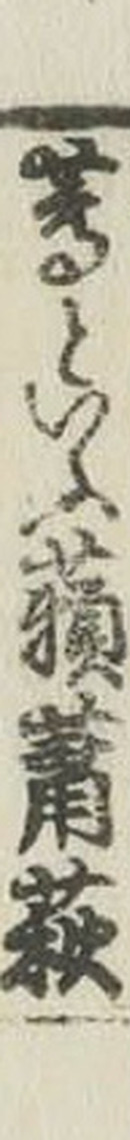蒿といふ藾蕭萩
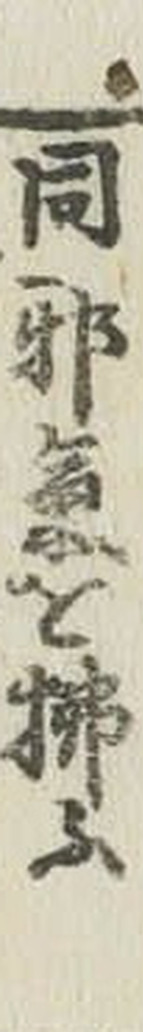同邪気を払う
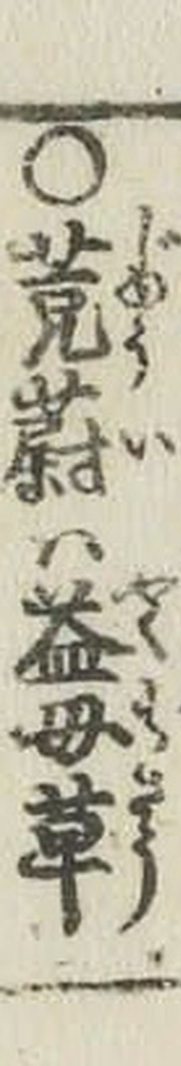○𦯇蔚は益母草
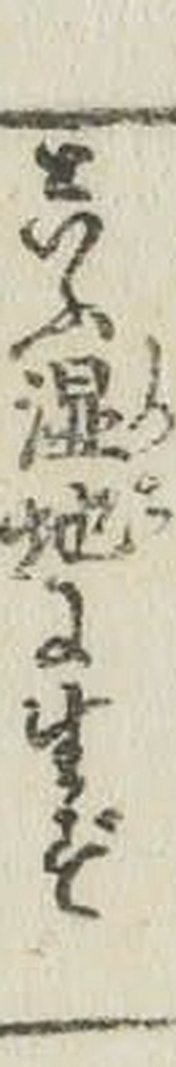といふ湿地に生ず
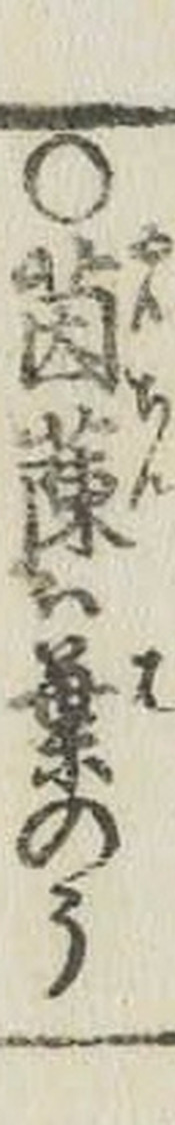○茵蔯は葉のう
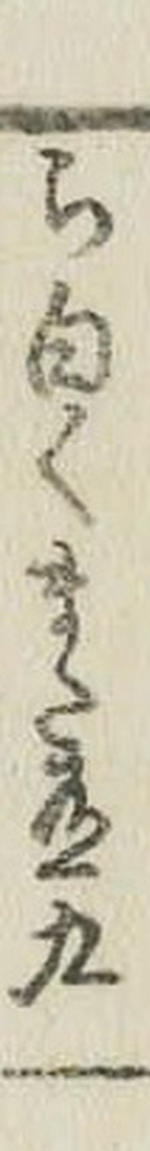ら白くまた有九
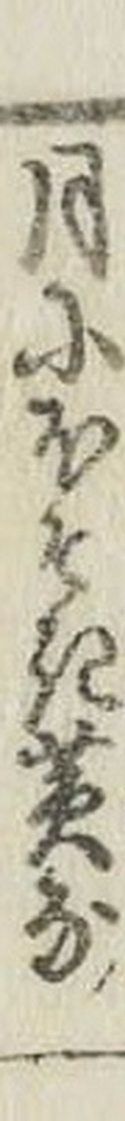月にほそき黄な
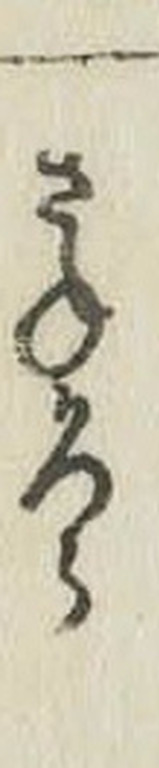さねかつら
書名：増補頭書訓蒙図彙大成 10巻 9:巻之20
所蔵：東京学芸大学教育コンテンツアーカイブ
